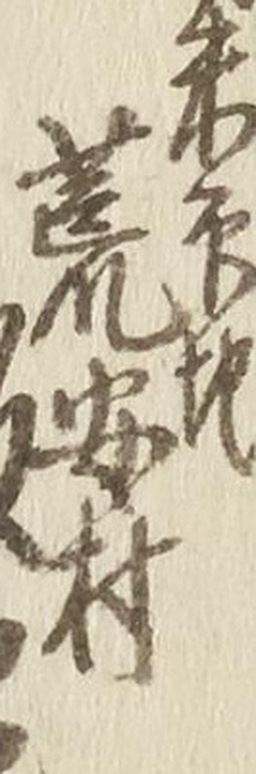荒安村
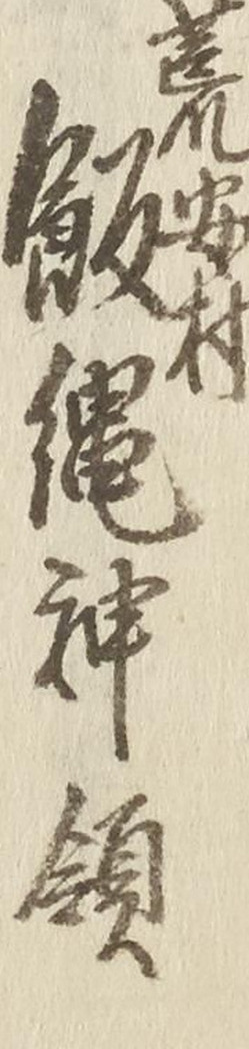飯縄神領
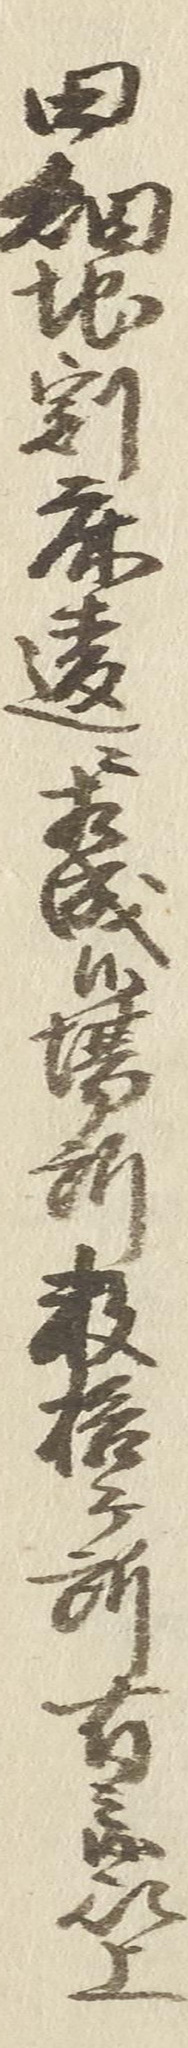田畑地割床違二相成候場所数拾ヶ所有之候以上

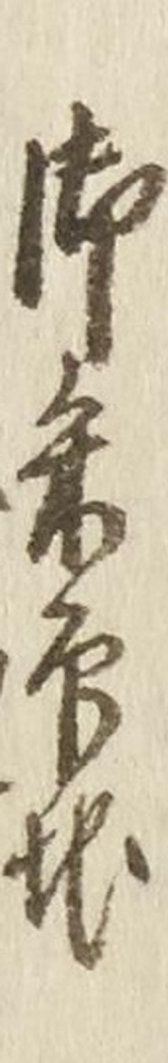御朱印地
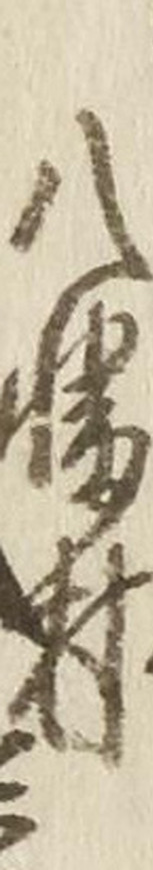八幡村
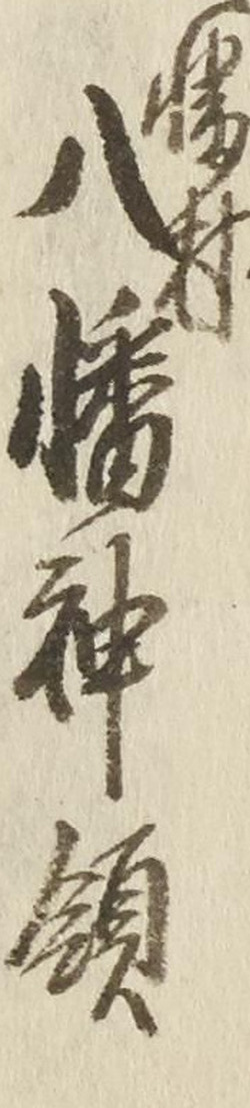八幡神領
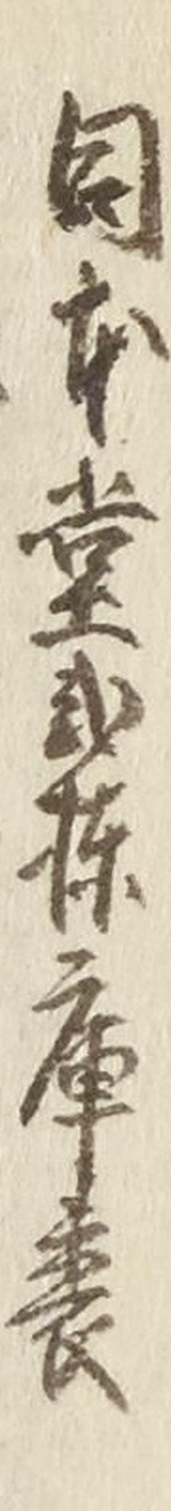一同本堂二棟庫裏
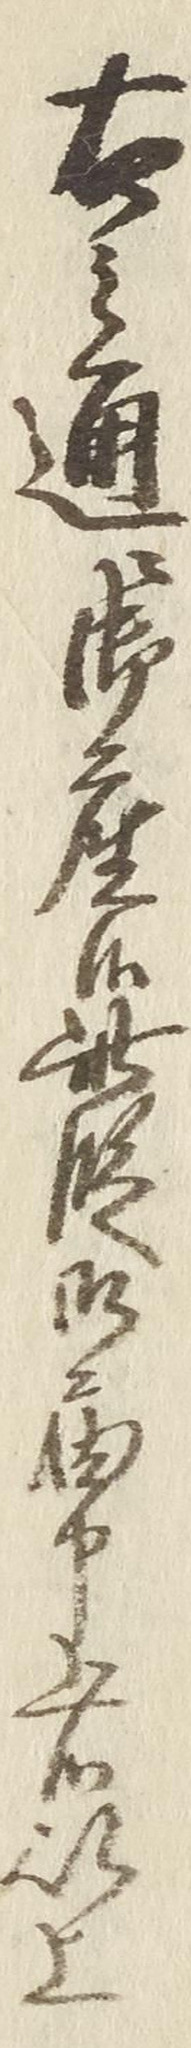右之通二御座候此段御届申上侯以上
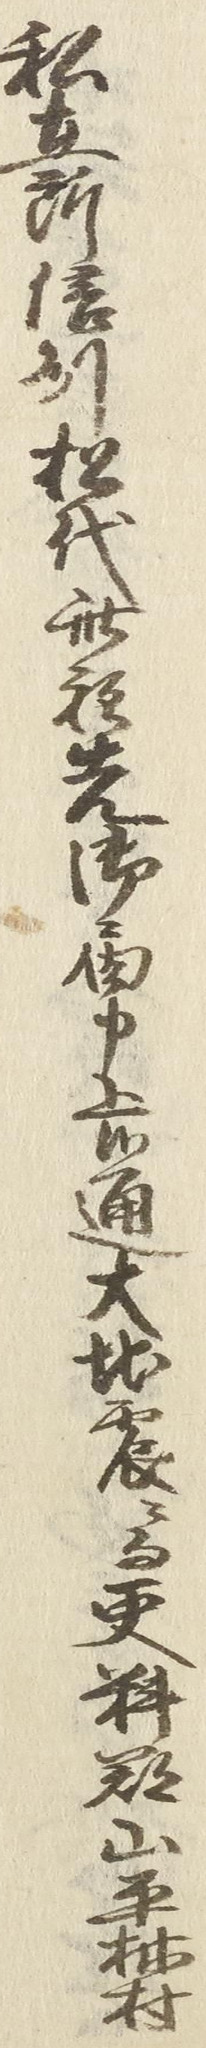私在所信州松代此程先御届申上候通大地震二而更級郡山平林村
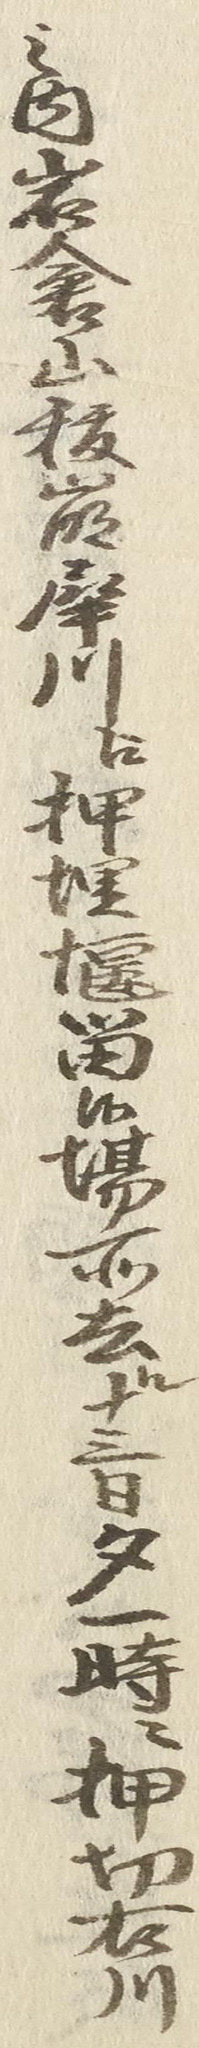之内岩倉山抜崩犀川江押埋堰留候場所去ㇽ十三日夕一時二押切右川
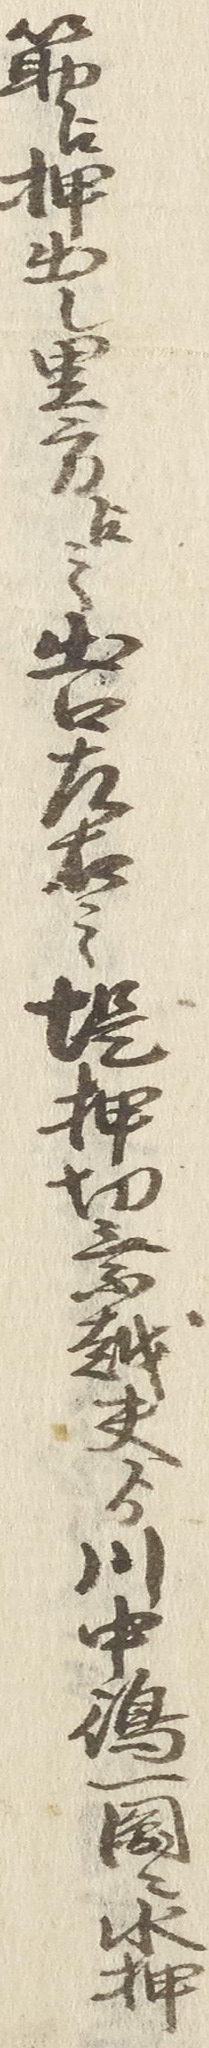筋江押出し里方江之出口左右之堰押切乗越夫ゟ川中嶋一円二水押
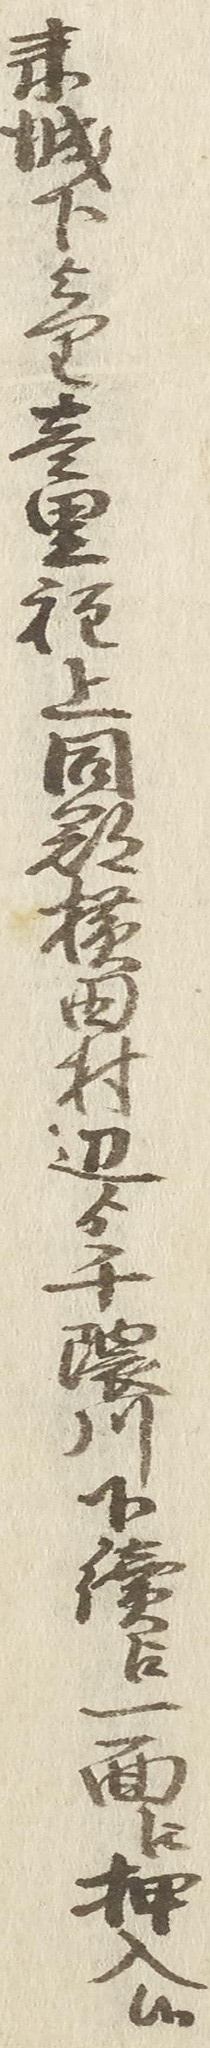来城下より壱里程上同郡横田村辺ゟ千隈川下続江一面江押入候
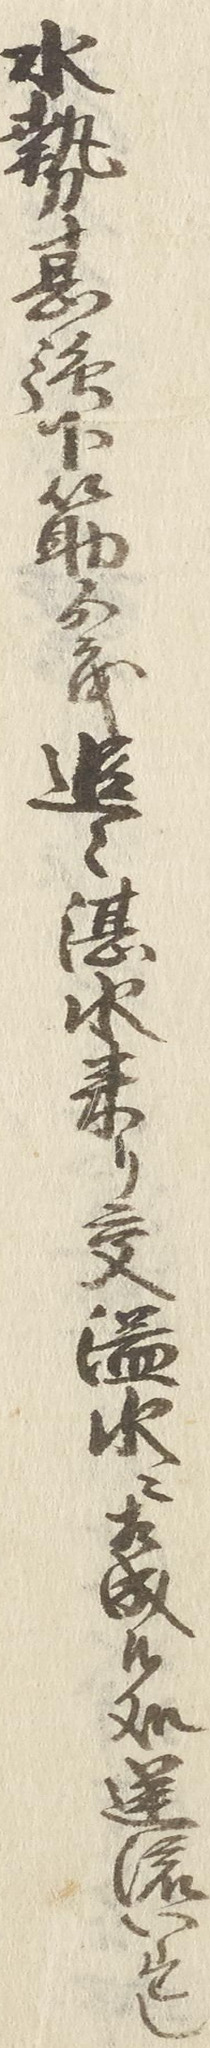水勢甚強下筋ゟも追々湛水来り交溢水二相成候処逆流いたし
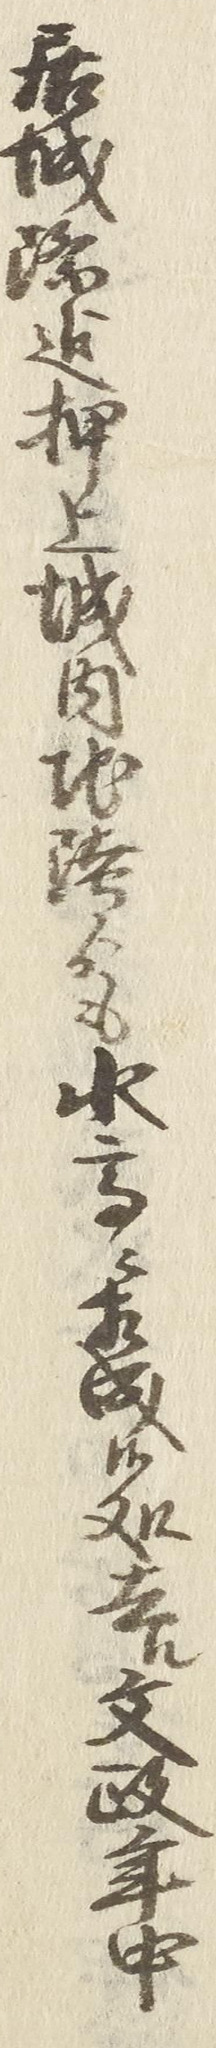居城際迄押上城内地陸ゟも水高二相成候処去文政年中
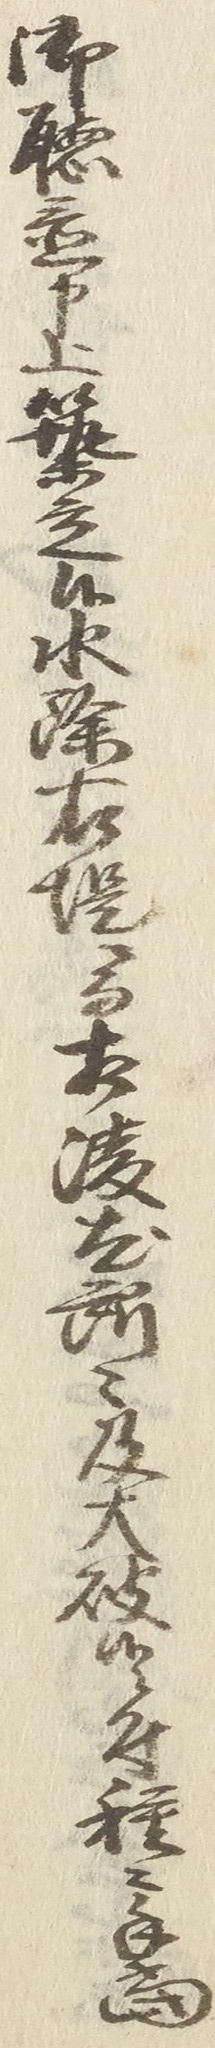御聴置申上築立候水除右堤二而相凌尤所々及大破候二付種々手当
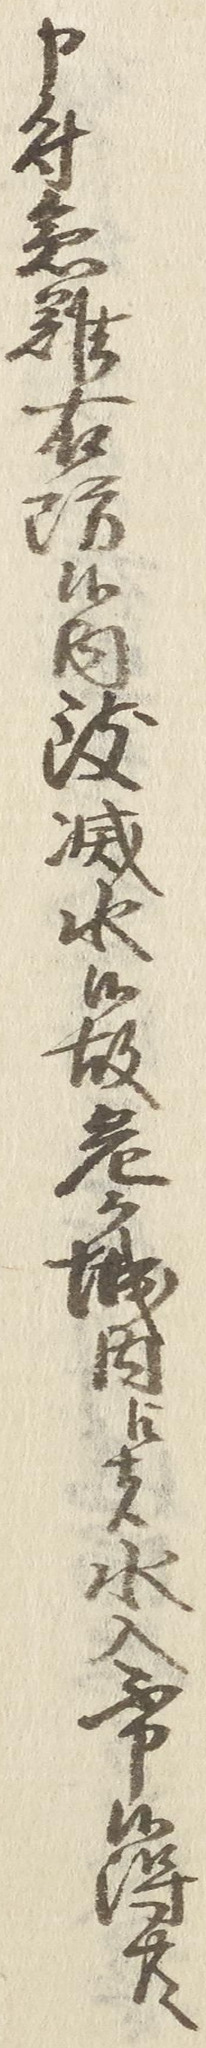申付急難右防候内致減水候故危ㇰ城内江は水入不申候江共
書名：従往古地震御届書記誌之一
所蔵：東京大学地震研究所図書室 Earthquake Research Institute Library, The University of Tokyo, JAPAN
